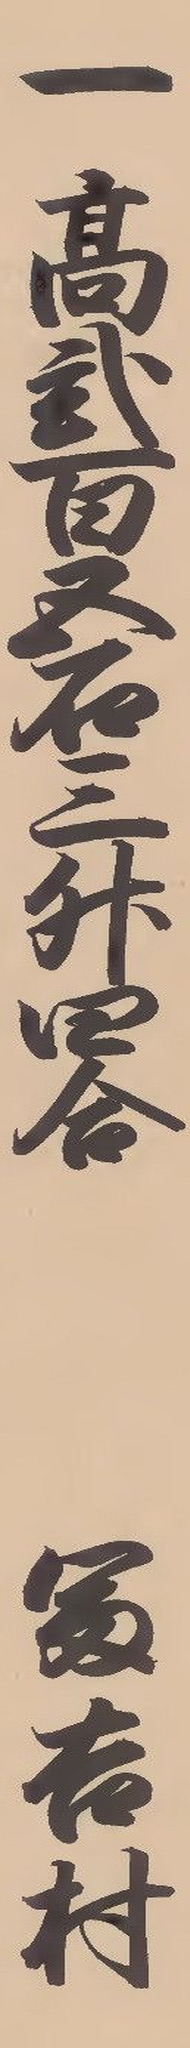一高弐百五石三升四合富吉村
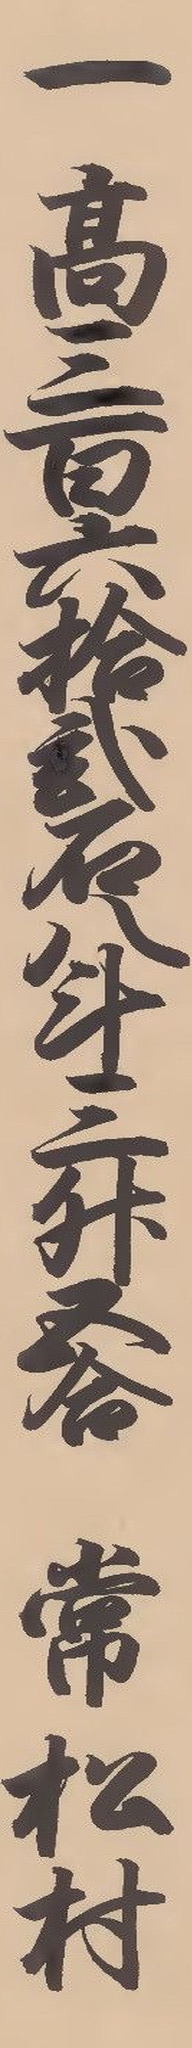一高三百六拾弐石八斗三升五合常松村
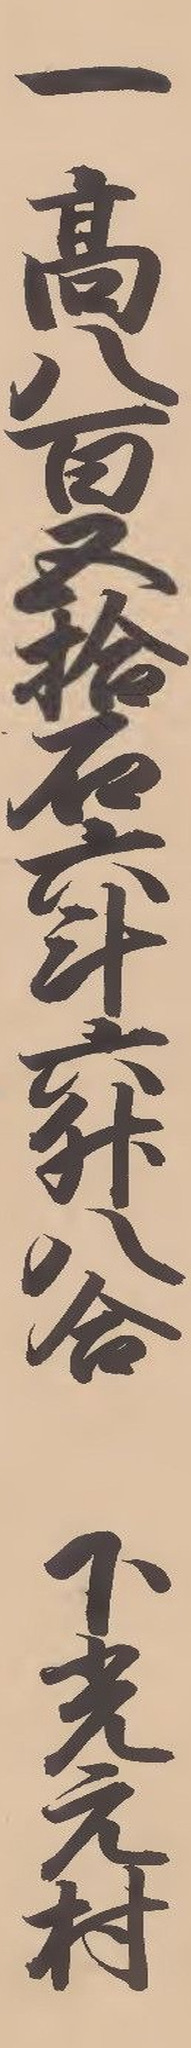一高八百五拾石六斗六升八合下光元村
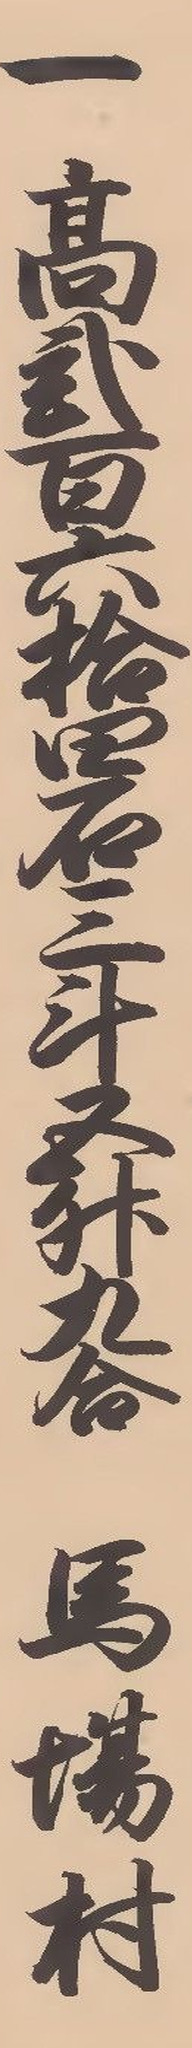一高弐百六拾四石三斗五升九合馬場村
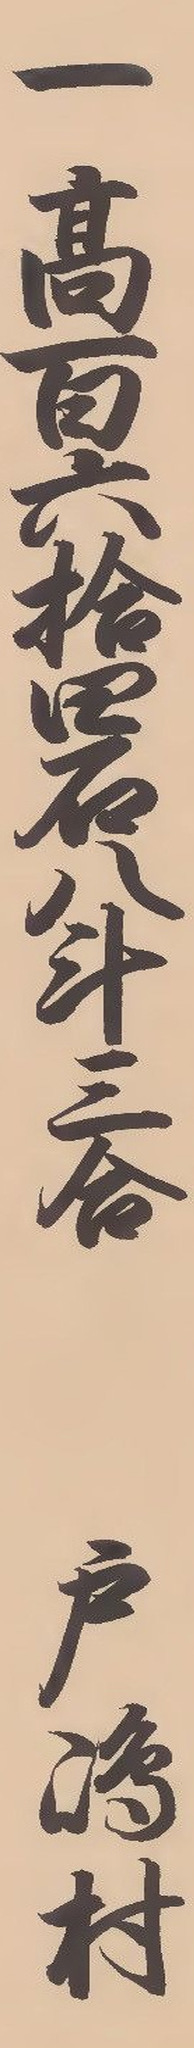一高百六拾四石八斗三合戸島村
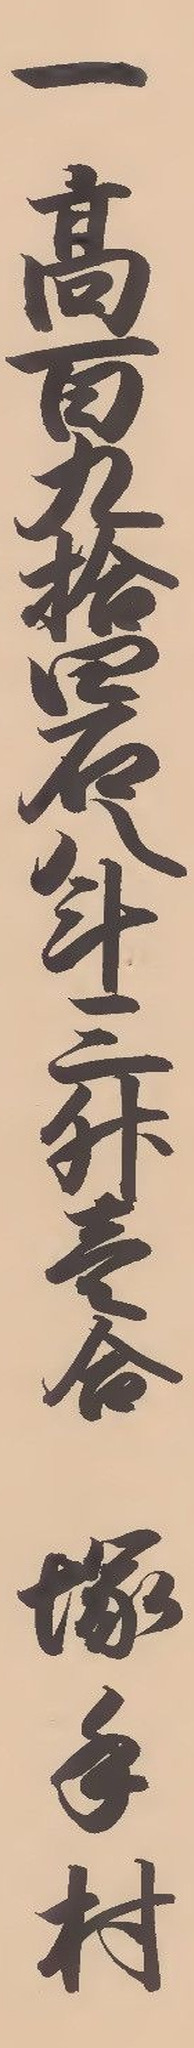一高百九拾四石八斗三升壱合塚手村
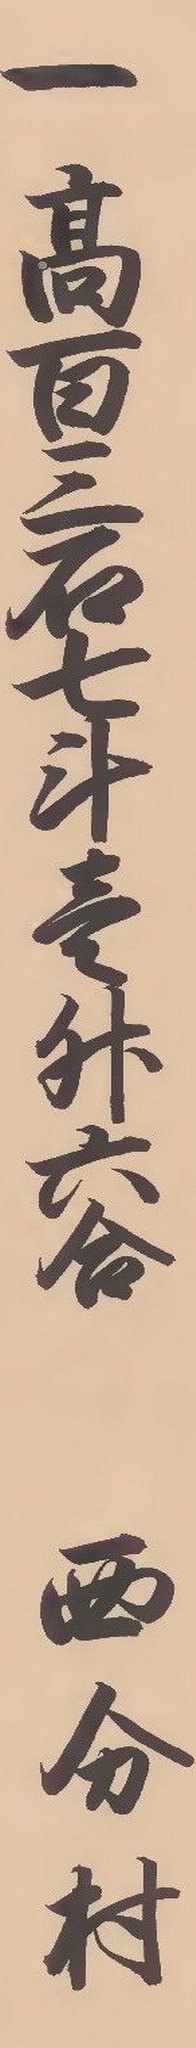一高百三石七斗壱升六合西分村

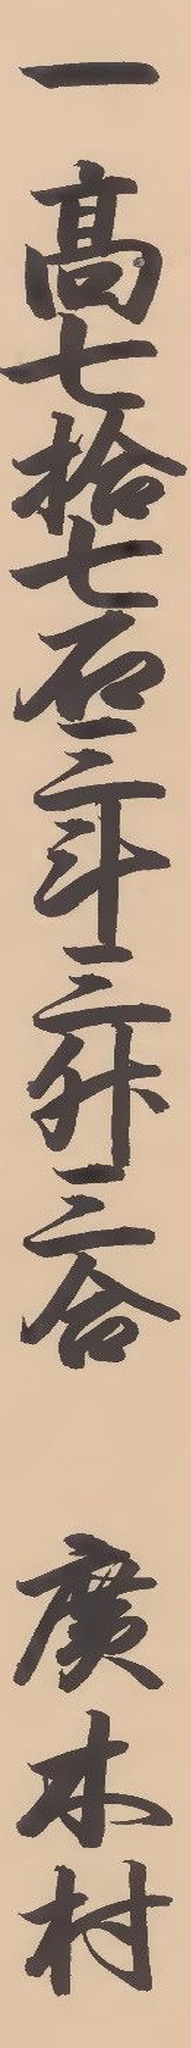一高七拾七石三斗三升三合広木村
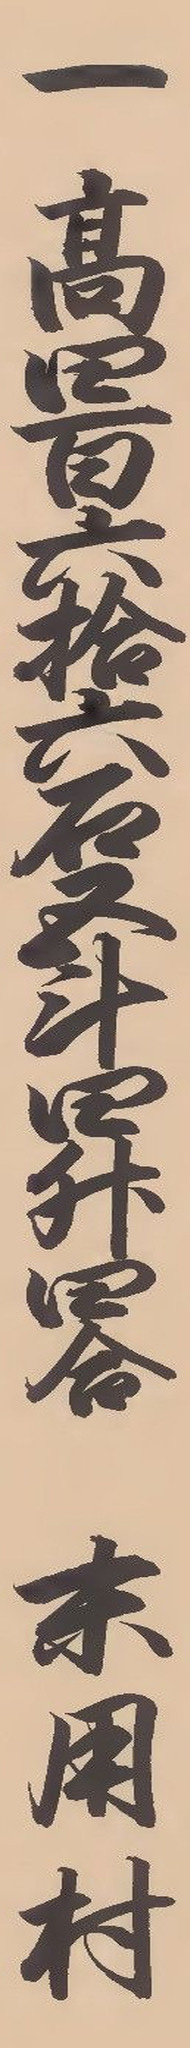一高四百六拾六石五斗四升四合末用村
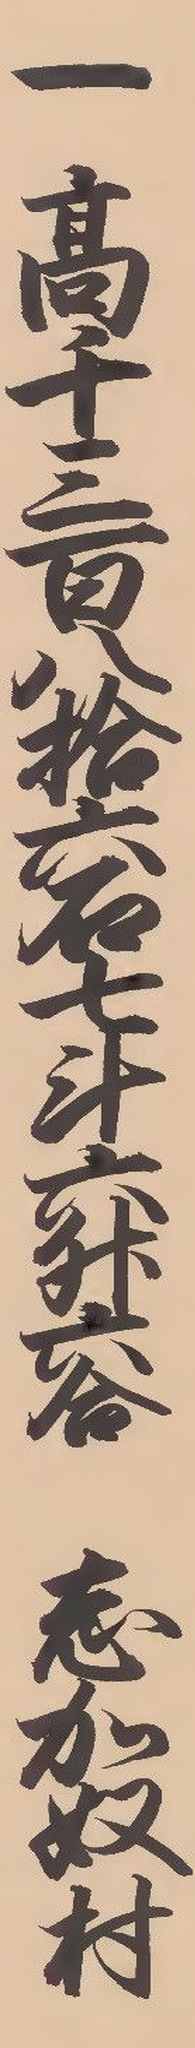一高千三百八拾六石七斗六升六合志加奴村
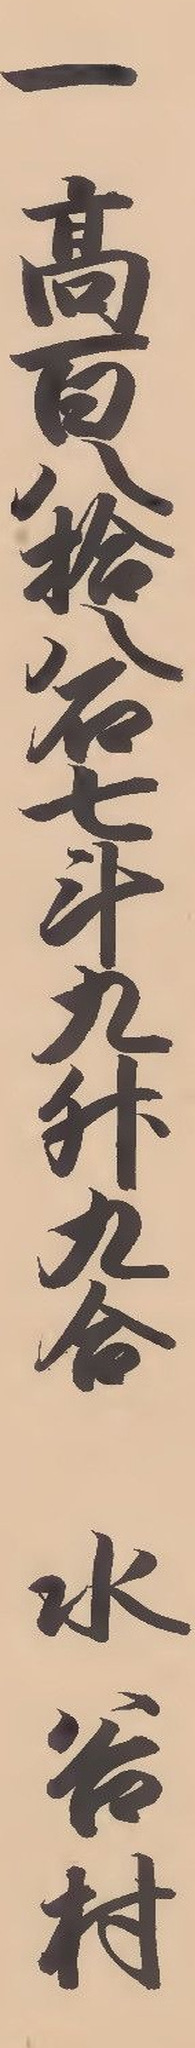一高百八拾八石七斗九升九合水谷村
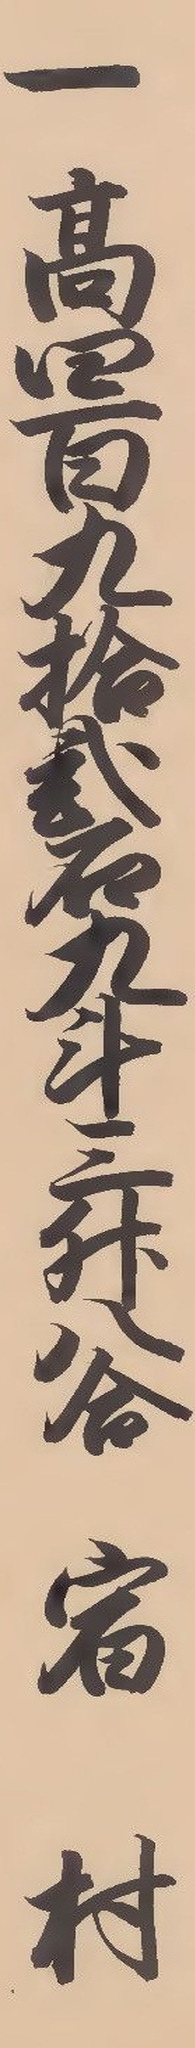一高四百九拾弐石九斗三升八合宿村
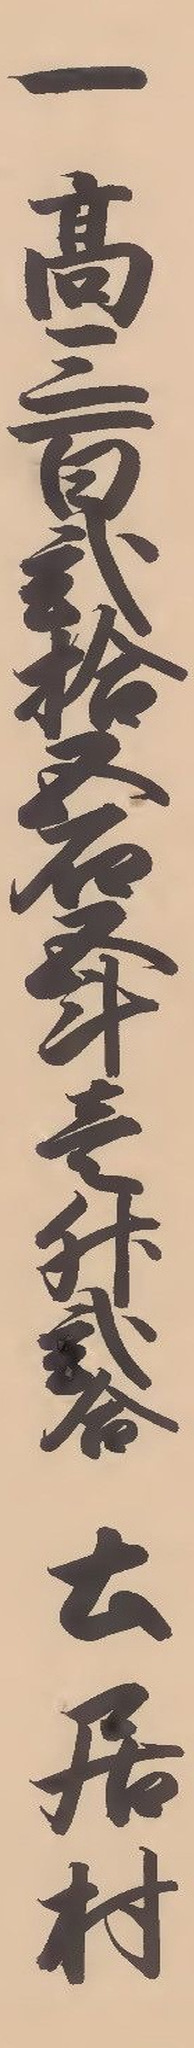一高三百弐拾五石五斗壱升弐合土居村
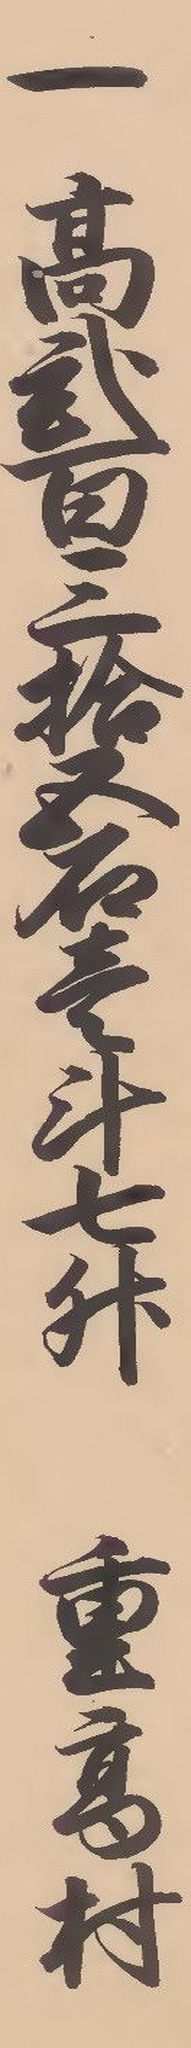一高弐百三拾五石壱斗七升重高村

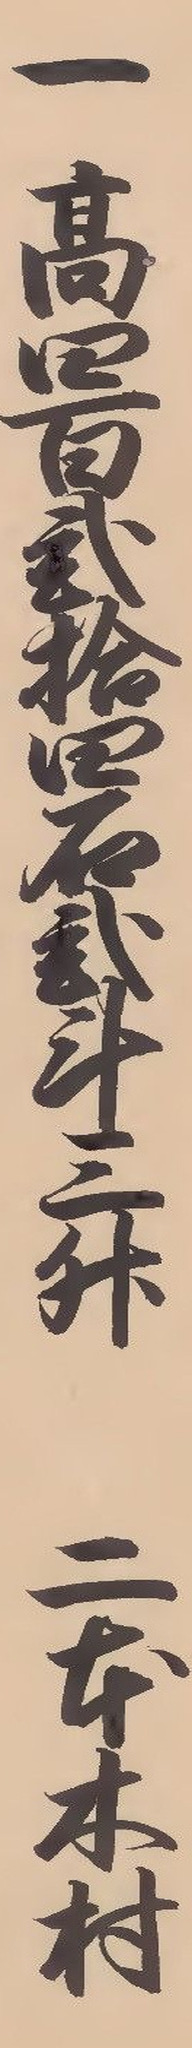一高四百弐拾四石弐斗三升二本木村
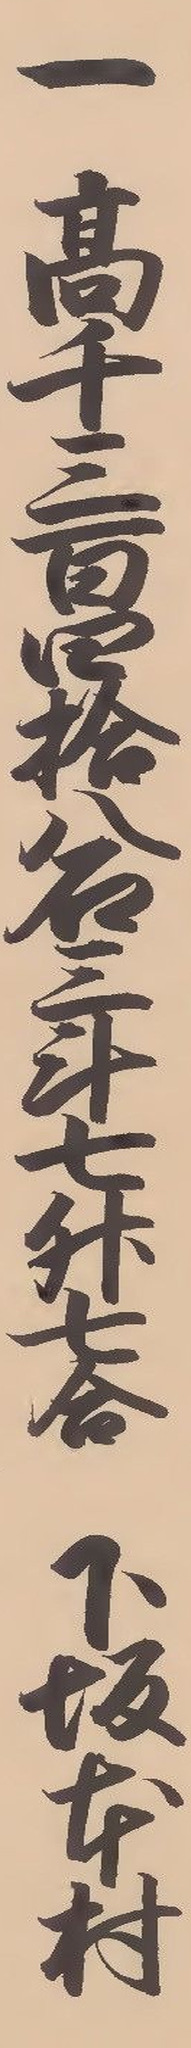一高千三百四拾八石三斗七升七合下坂本村
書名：因幡国郷帳
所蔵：国立公文書館 National Archives of Japan
